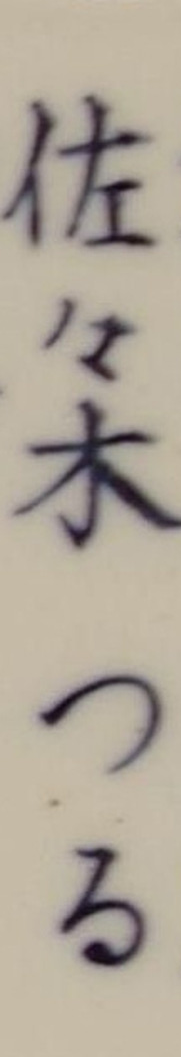佐々木つる
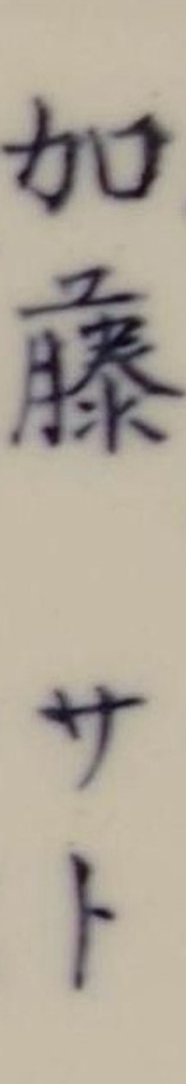加藤サト
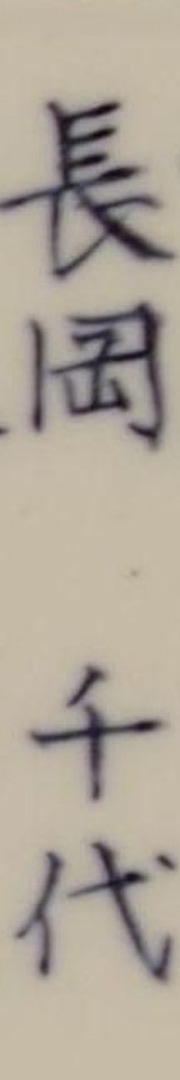長岡千代
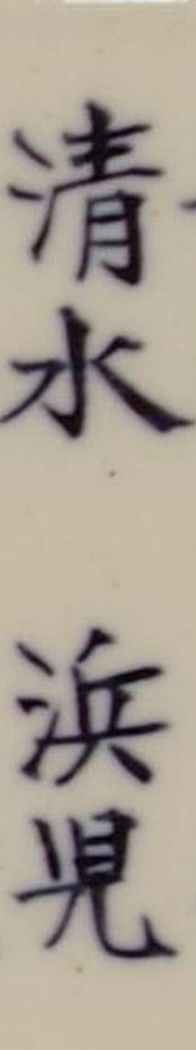清水浜児
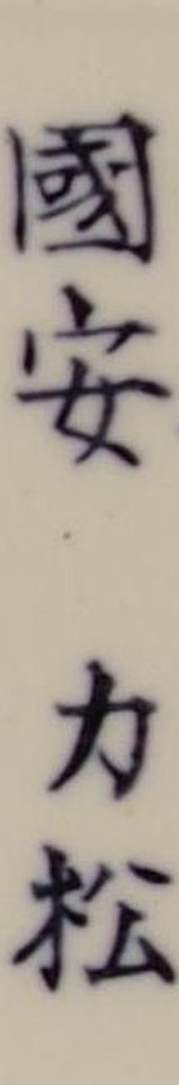國安力松
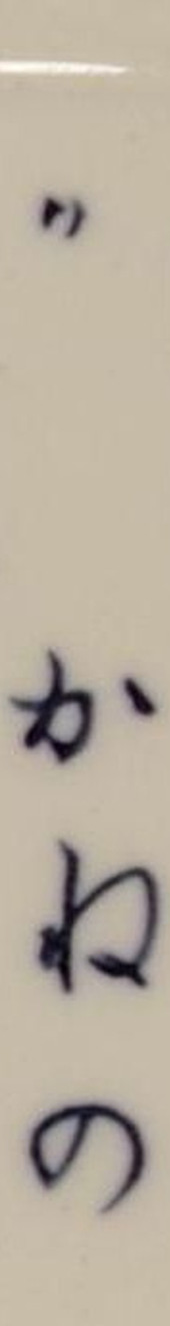かねの
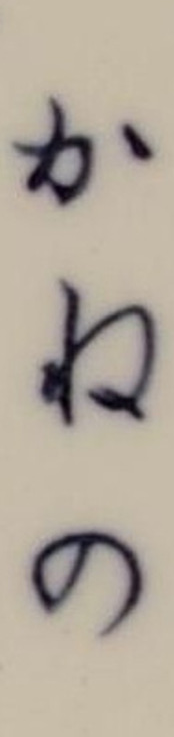かねの
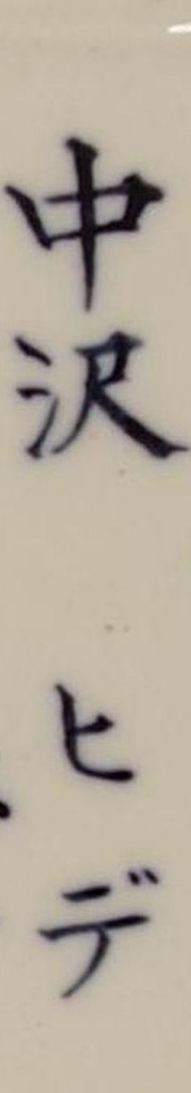中沢ヒデ
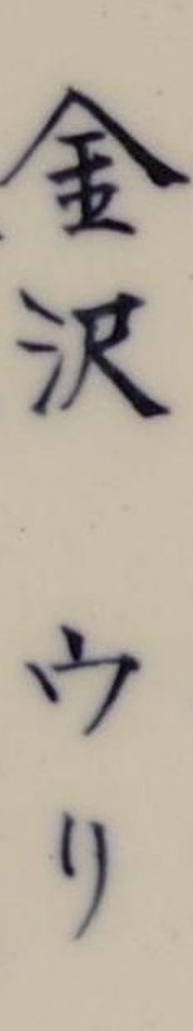金沢ウリ
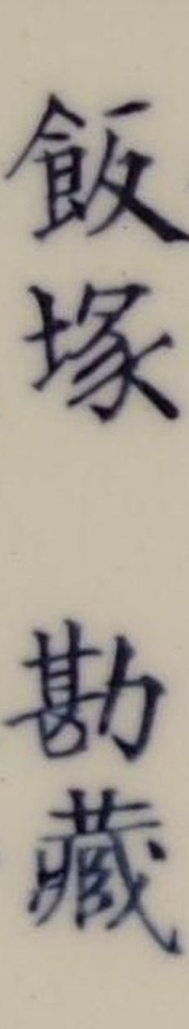飯塚勘蔵
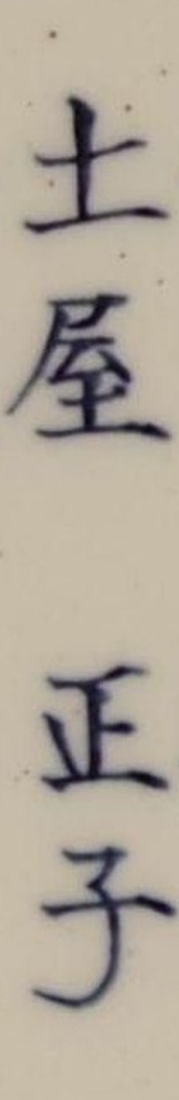土屋正子
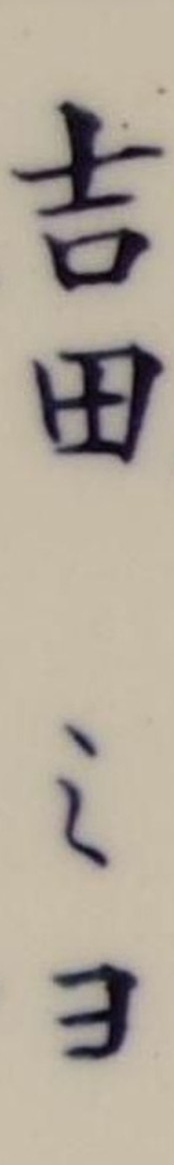吉田ミヨ
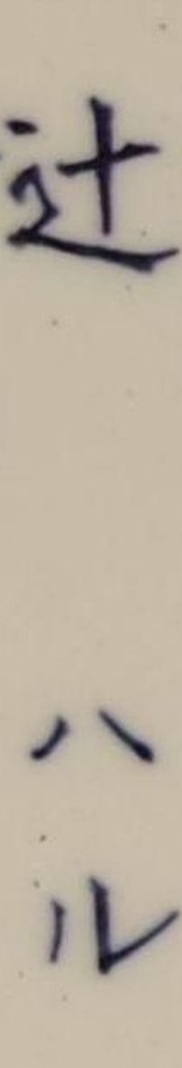辻ハル
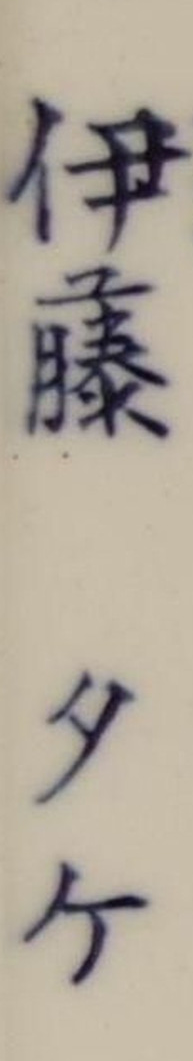伊藤タケ

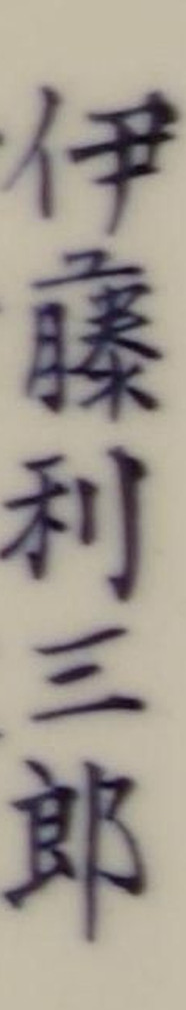伊藤利三郎
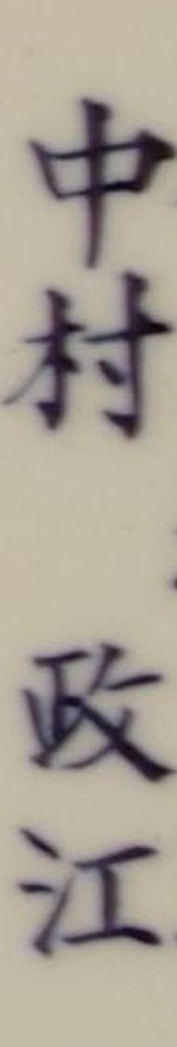中村政江
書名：E~L
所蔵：高野山金剛峯寺
